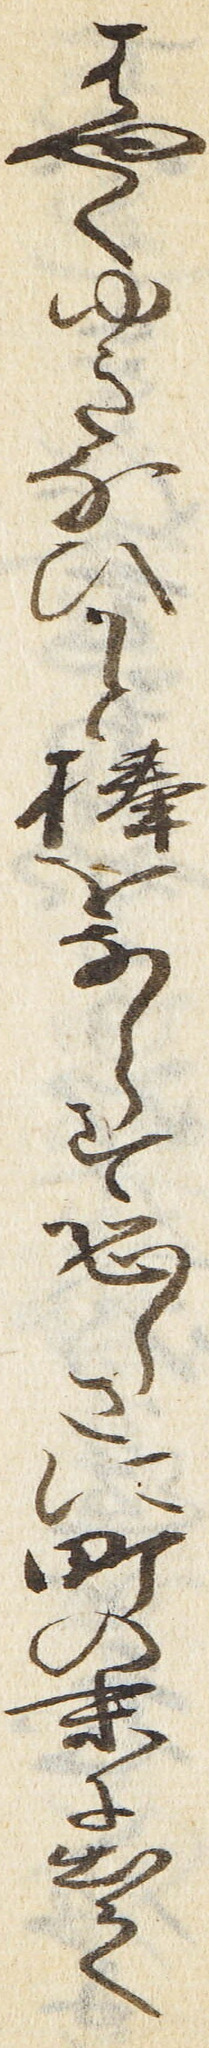はやくゆきなひかと棒をならす恐しさに町の末に出て
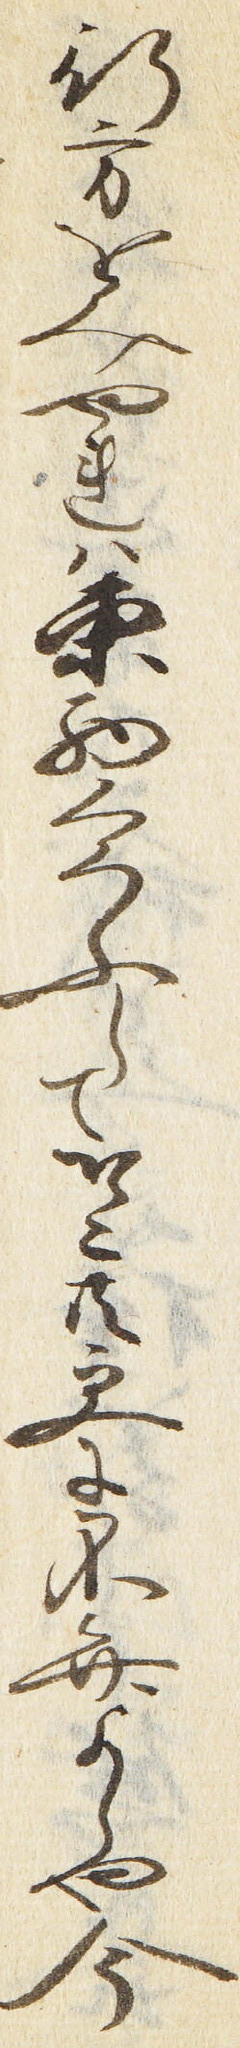行方をみやれは東西くろふしてそこ共更に不弁よしや今
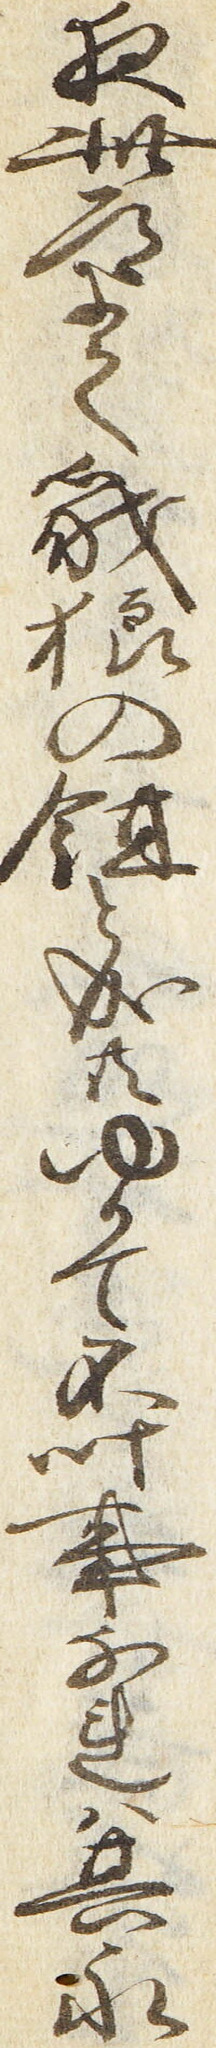夜此道にて豺狼の餌と成共ゆかて不叶事なれは其永
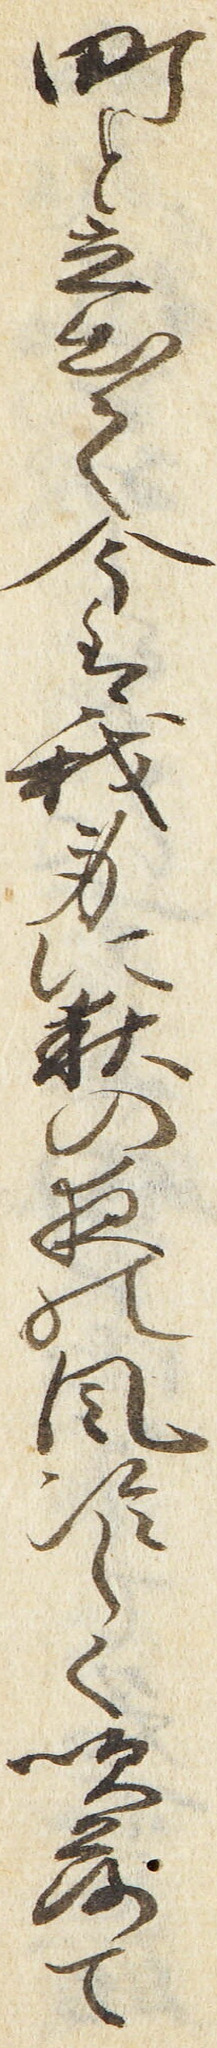町と立出て今は我身に秋の夜の風冷しく吹落て

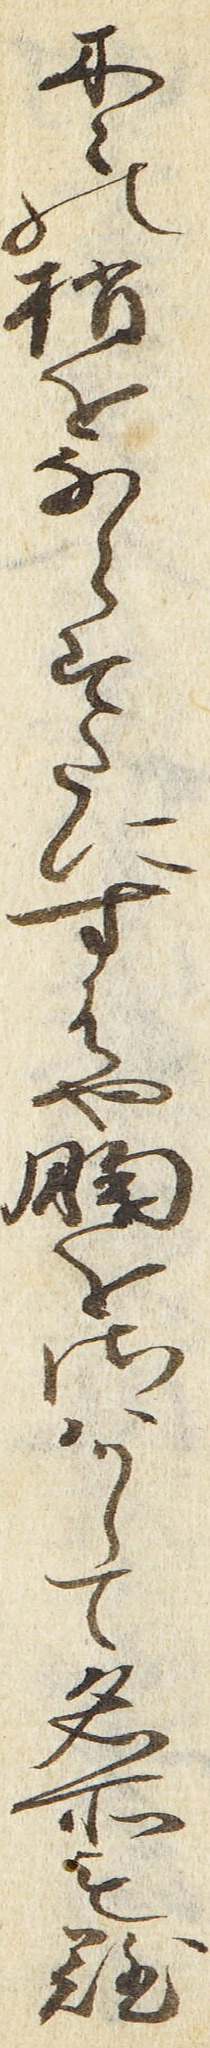木々の梢をならすたにすはや胸をさはかして名所を難
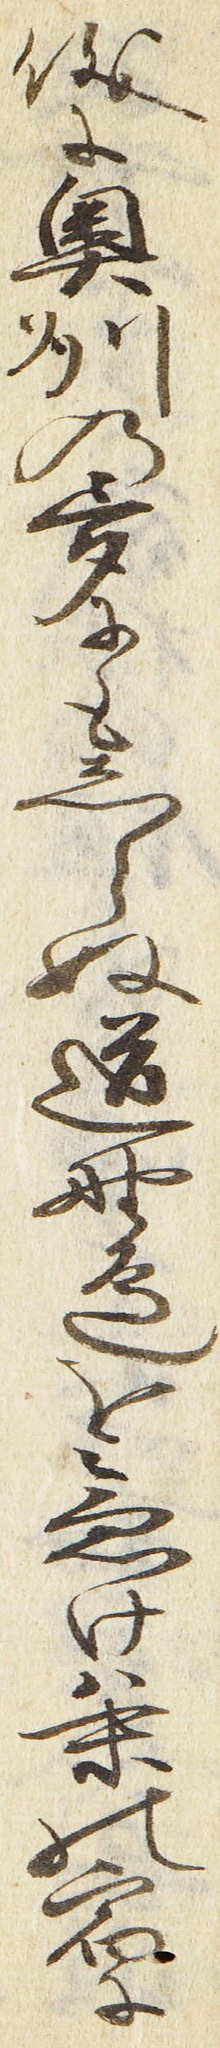儀に奥州の夢にもしらぬ道野辺を急けは末の宿に
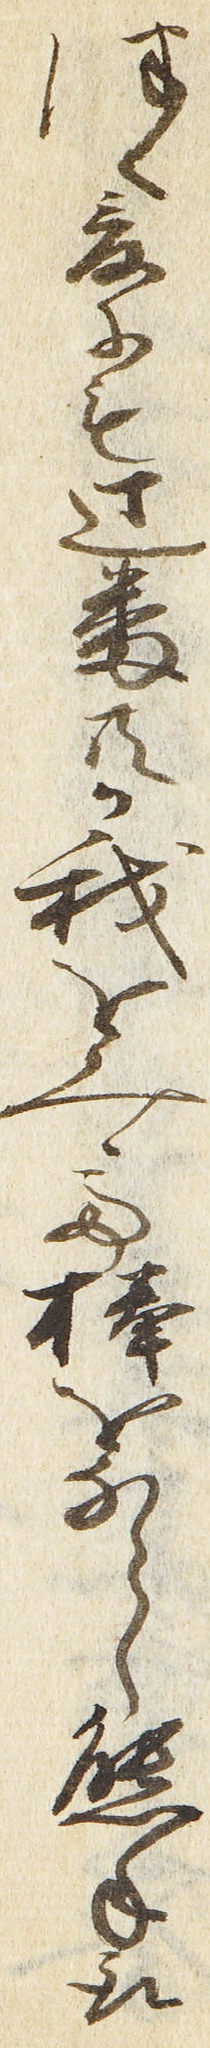つく爰にも辻番共か我をみて棒をならし熊手取
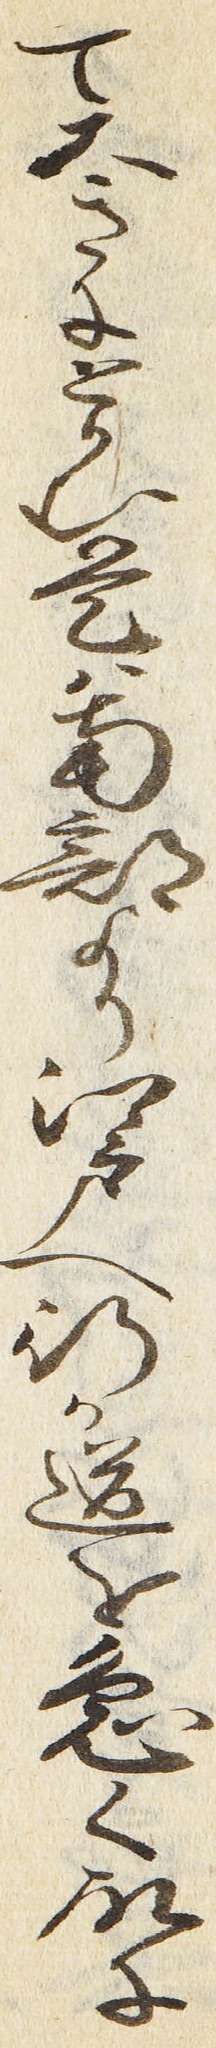て大きにとかむ是は南部より江戸へ行か道を急く故に
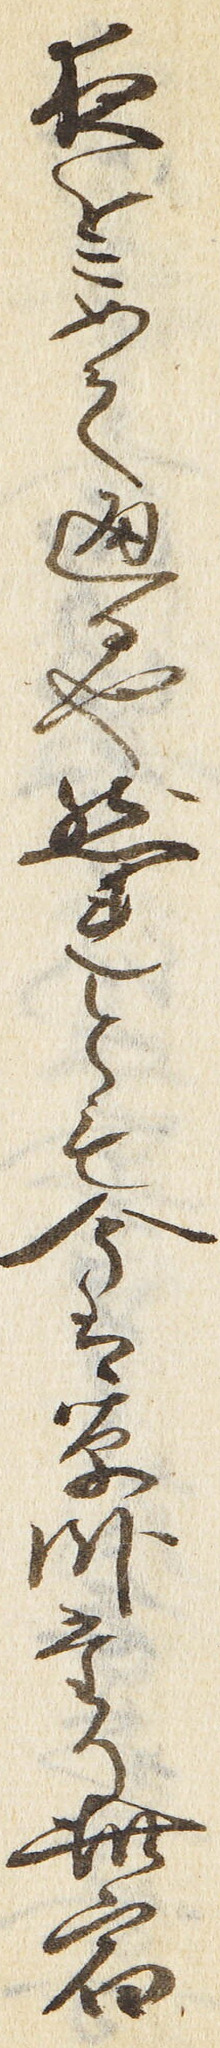夜をこめて通る也然れとも今は草臥たり此宿
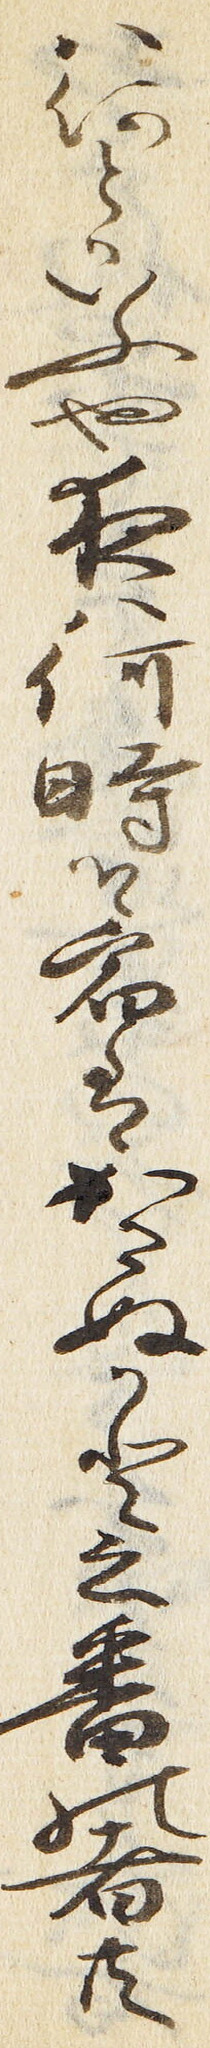は何といふや夜は何時そ宿はかさぬかと云番の者共
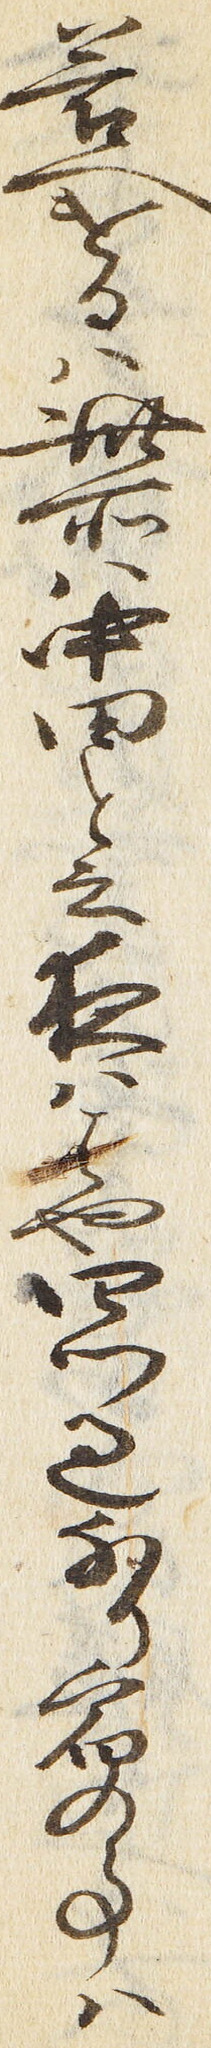答へけるは此所は中田と云夜ははや四ツ過なり宿の事は
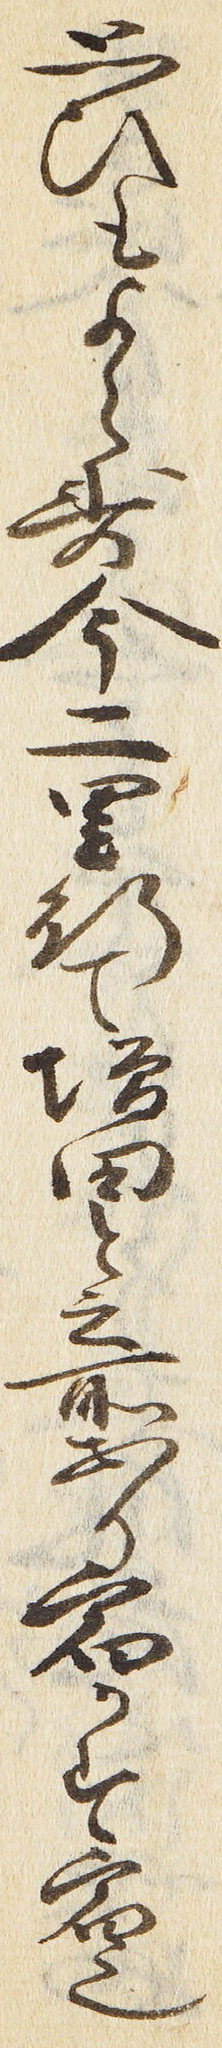思ひもよらす今二里行て増田と云所あり宿かす宿也
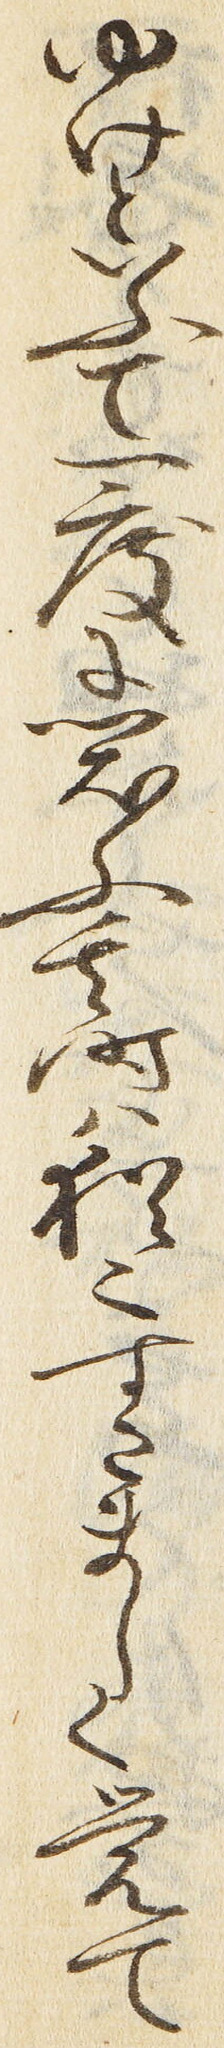ゆけといふて一度に笑ふ其時ハ猶々すさましく覚て
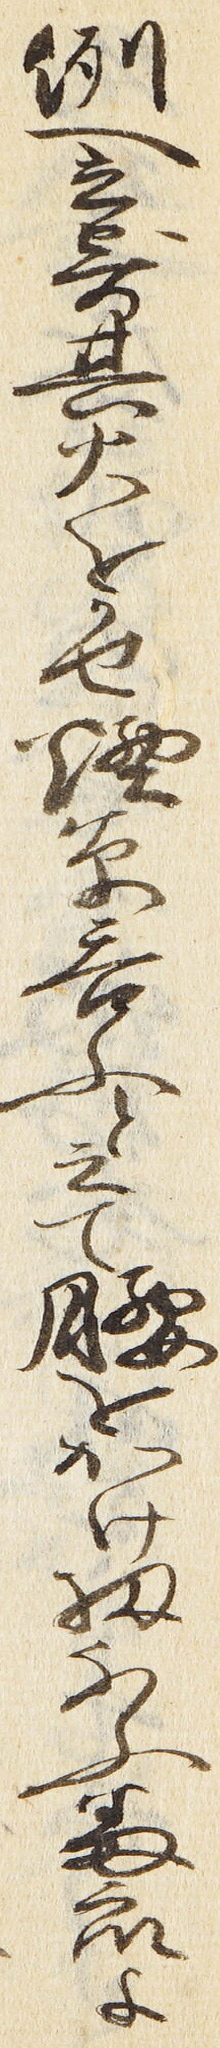側へ立寄其火をかせ煙草呑ふと云て腰をかけ扨なふ番衆よ
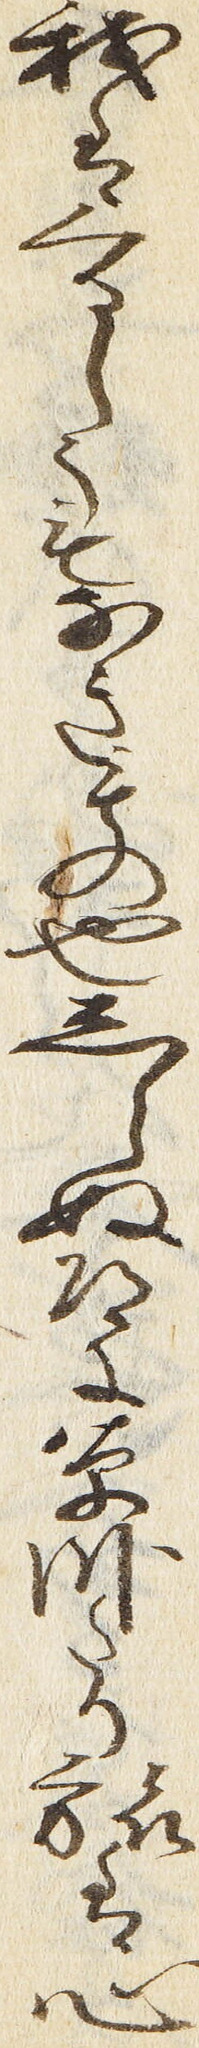我はくるしうもなきもの也しらぬ道に草臥たり旅は心
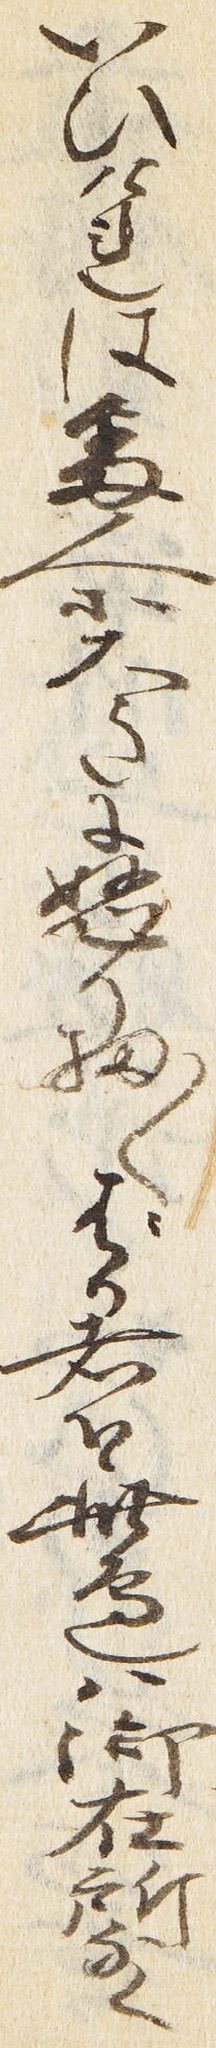いひけれは番人等大きに怒り扨〳〵ばか者そ此辺は御在所なく
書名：海陸世話日記
